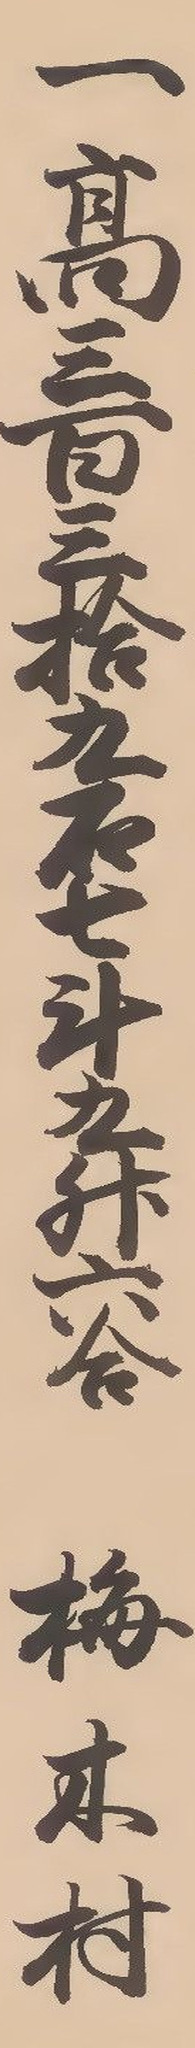一高三百三拾九石七斗九升六谷梅木村
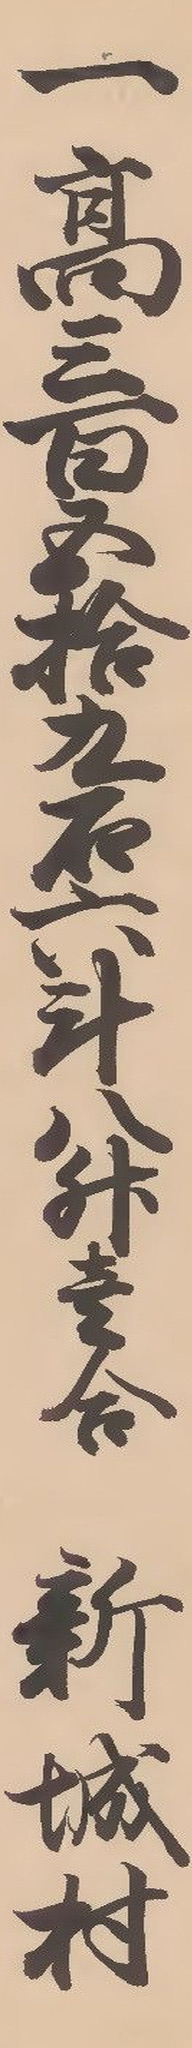一高三百五拾九石六斗八升壱合新城村
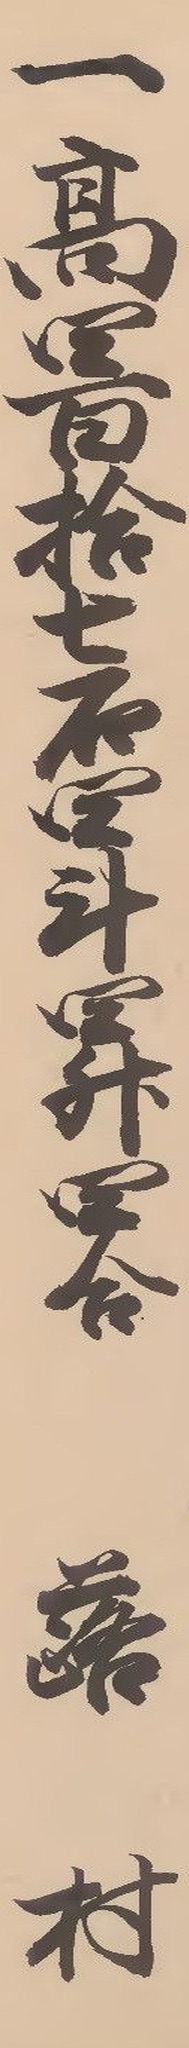一高四百拾七石四斗四升四合蕗村
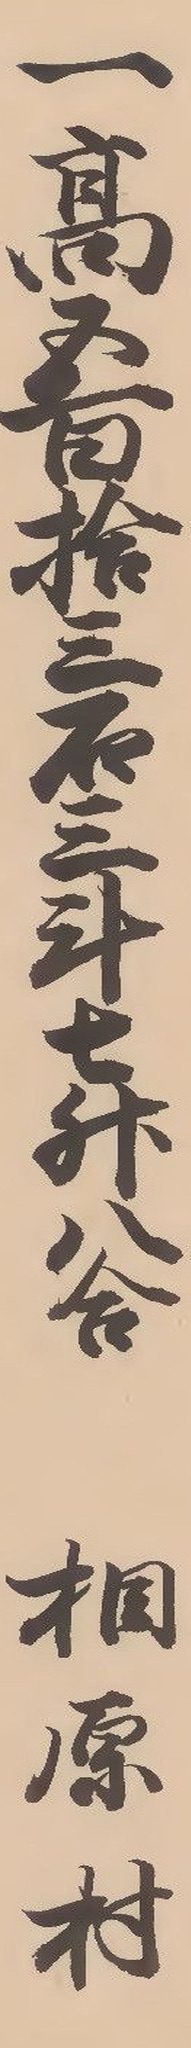一高五百拾三石三斗七升八合相原村
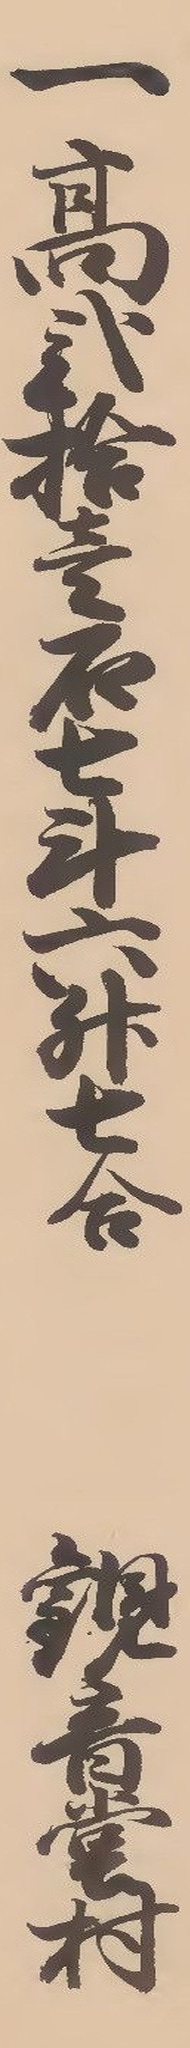一高弐拾壱石七斗六升七合観音堂村
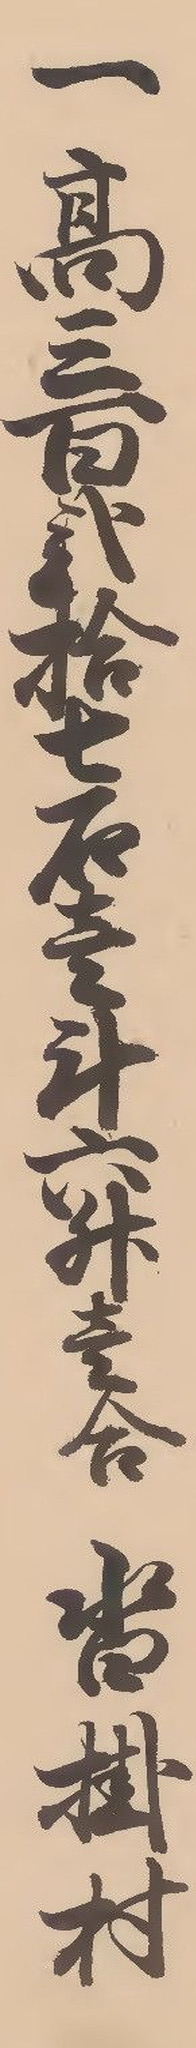一高三百弐拾七石壱斗六升壱合沓掛村

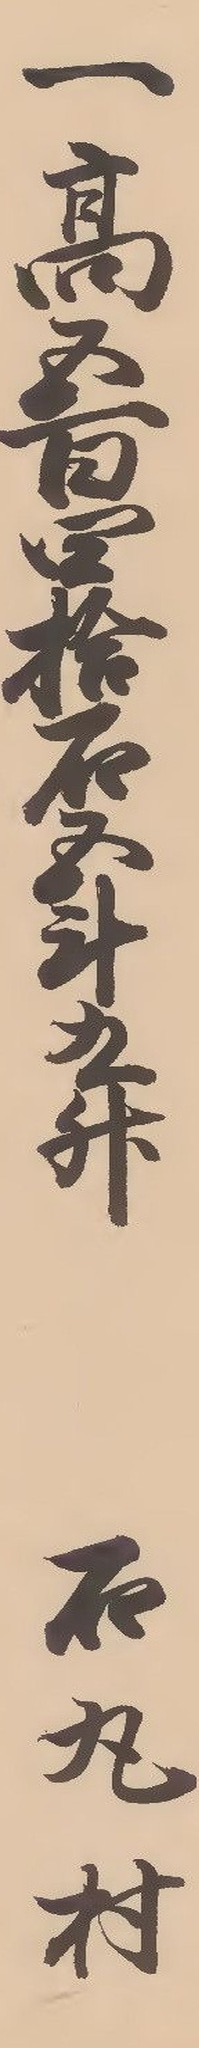一高五百四拾石五斗九升石丸村
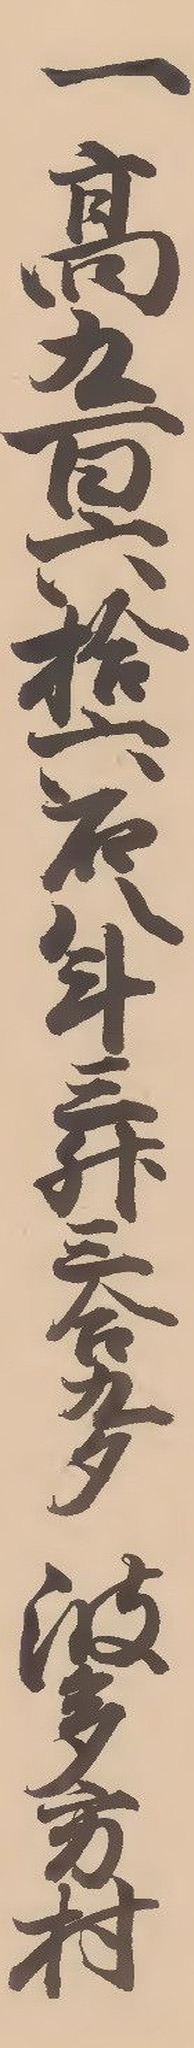一高九百六拾六石八斗三升三合九勺波多方村
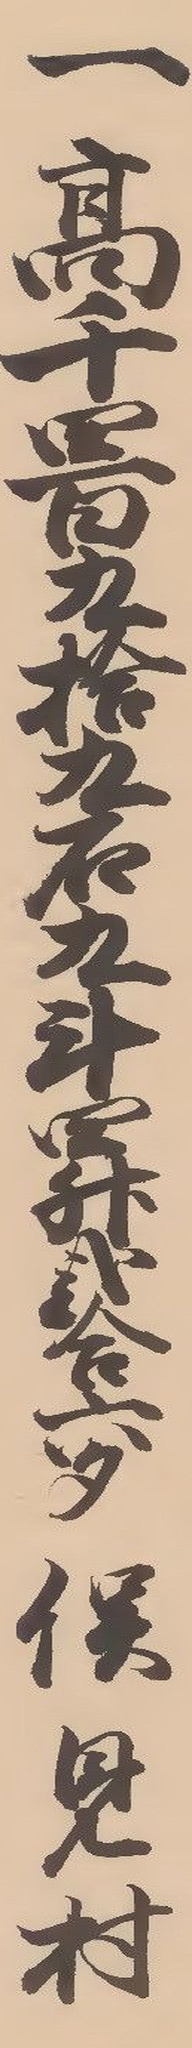一高千四百九拾九石九斗四升弐合六勺俣見村
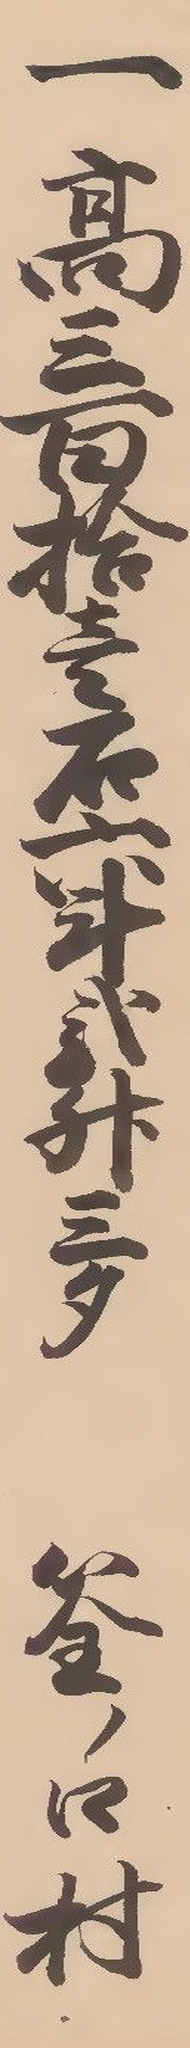一高三百拾壱石六斗弐升三勺釜ノ口村
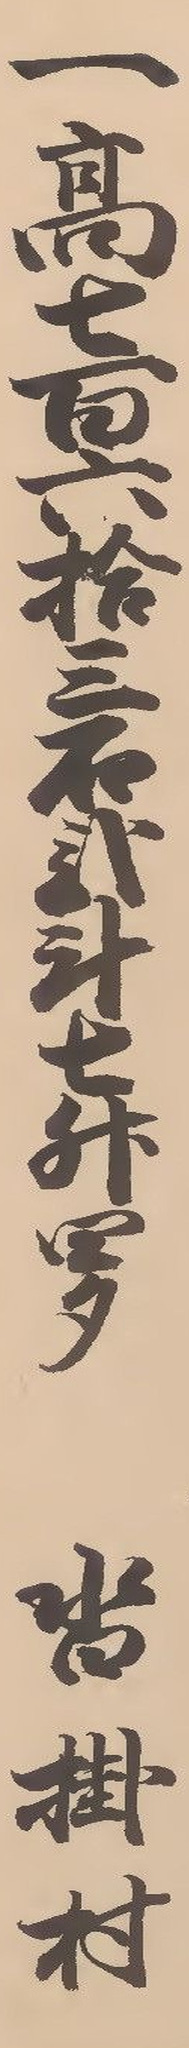一高七百六拾三石弐斗七升四勺沓掛村
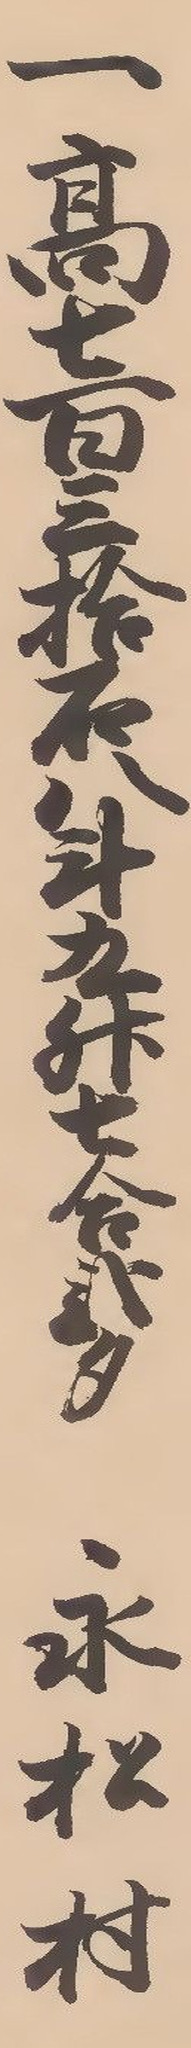一高七百三拾石八斗九升七合弐勺永松村
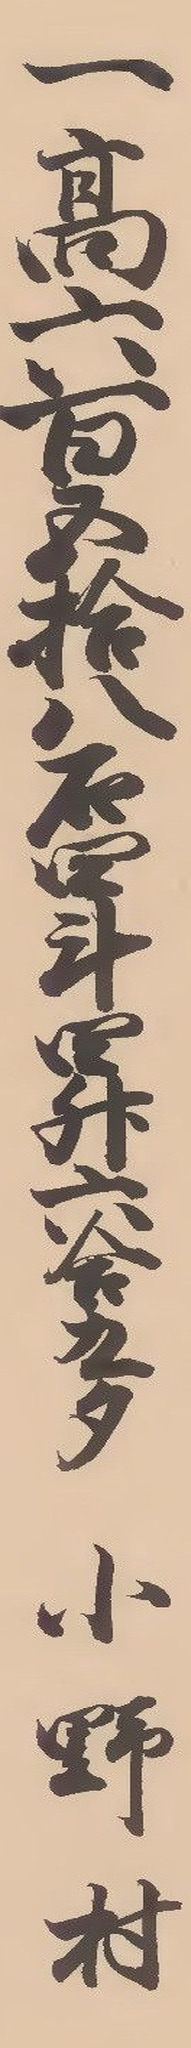一高六百五拾八石四斗四升六合九勺小野村
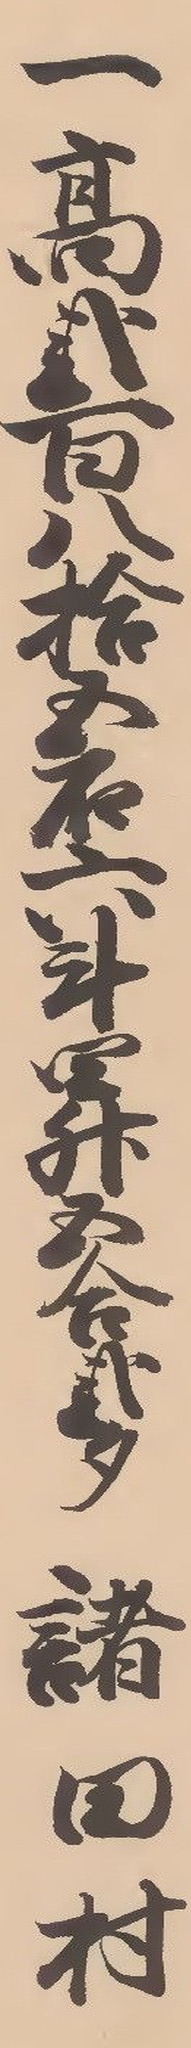一高弐百八拾五石六斗四升五合弐勺諸田村

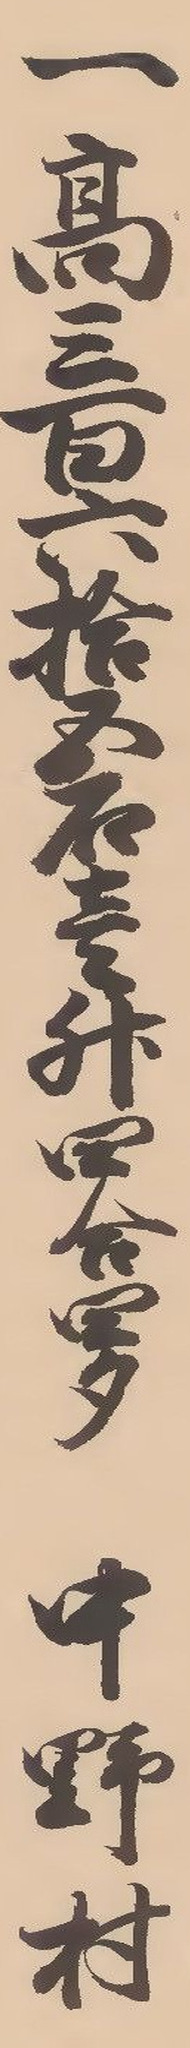一高三百六拾五石壱升四合四勺中野村
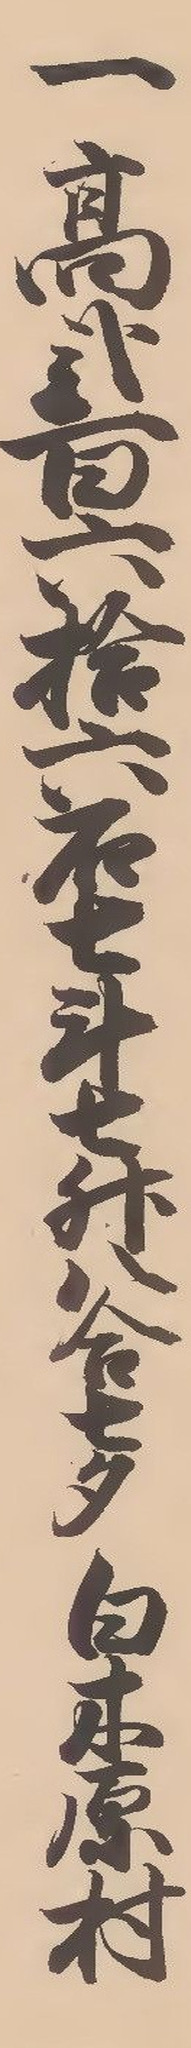一高弐百六拾六石七斗七升八合七勺白木原村
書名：豊後国郷帳
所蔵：国立公文書館 National Archives of Japan
